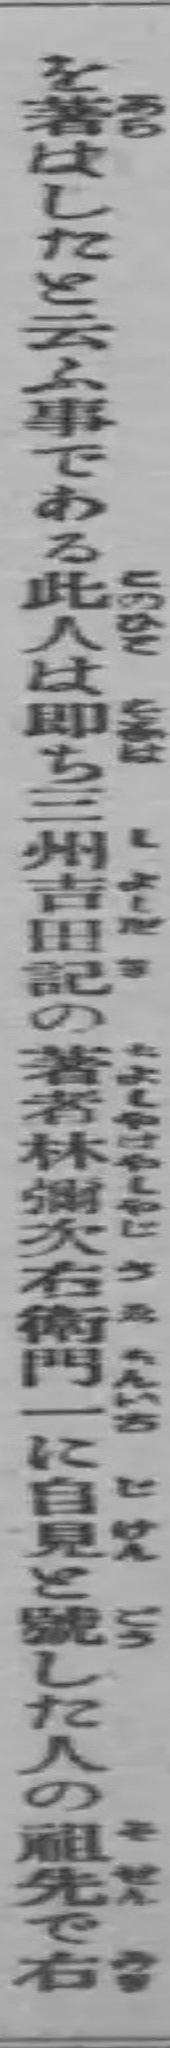を著はしたと云ふ事である此人は即ち三州吉田記の著者林弥次右衛門一に自見と号した人の祖先で右
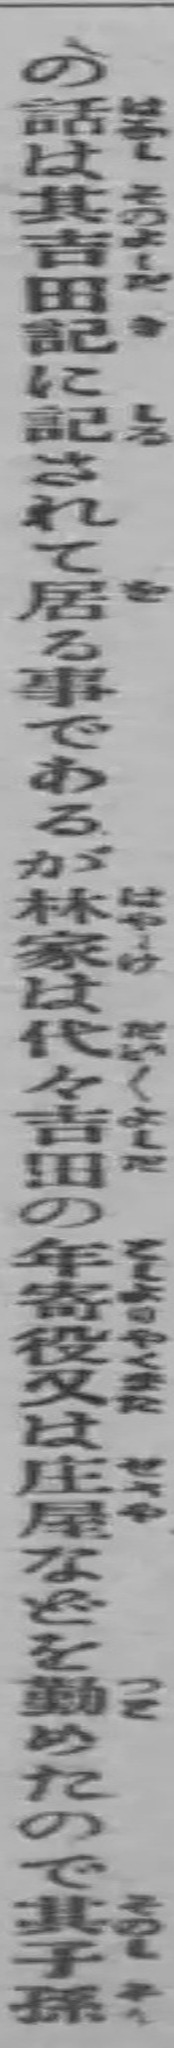の話は其吉田記に記されて居る事であるが林家は代々吉田の年寄役又は庄屋などを勤めたので其子孫
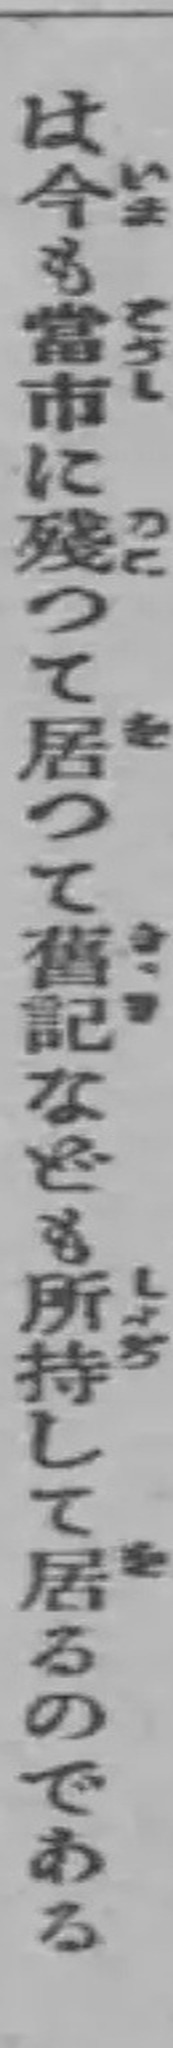は今も当市に残つて居つて旧記なども所持して居るのである
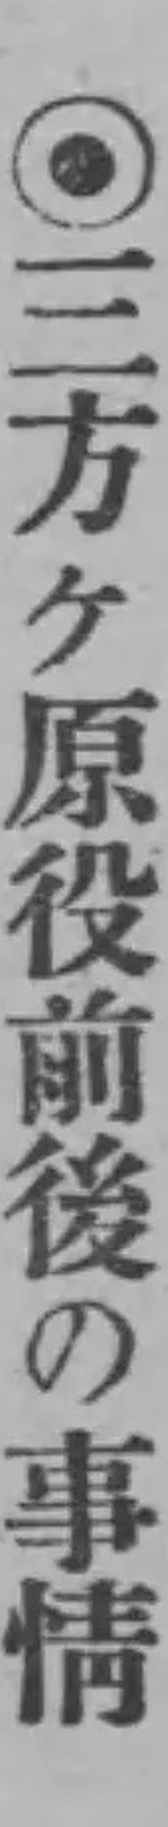⦿三方ヶ原役前後の事情
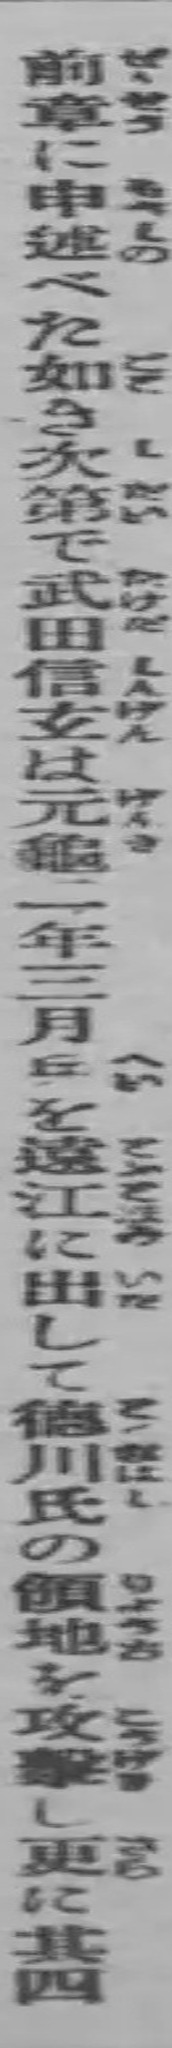前章に申述べた如き次第で武田信玄は元亀一年三月兵を遠江に出して徳川氏の領地を攻撃し更に其四
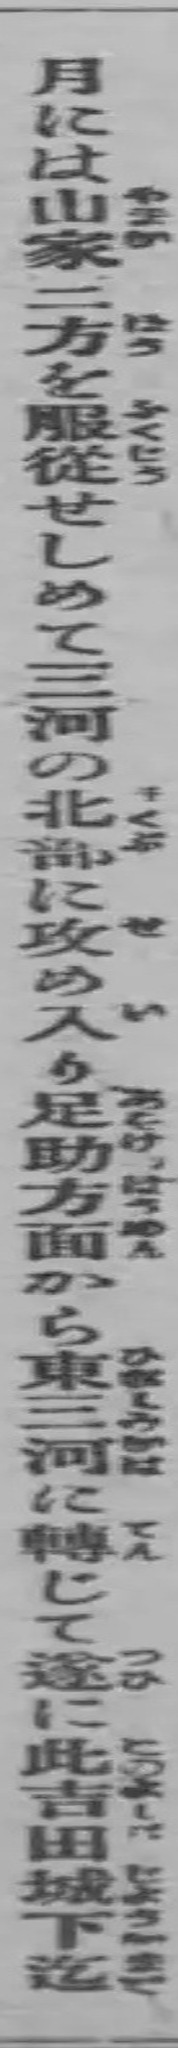月には山家二方を服従せしめて三河の北部に攻め入り足助方面から東三河に転じて遂に此吉田城下迄
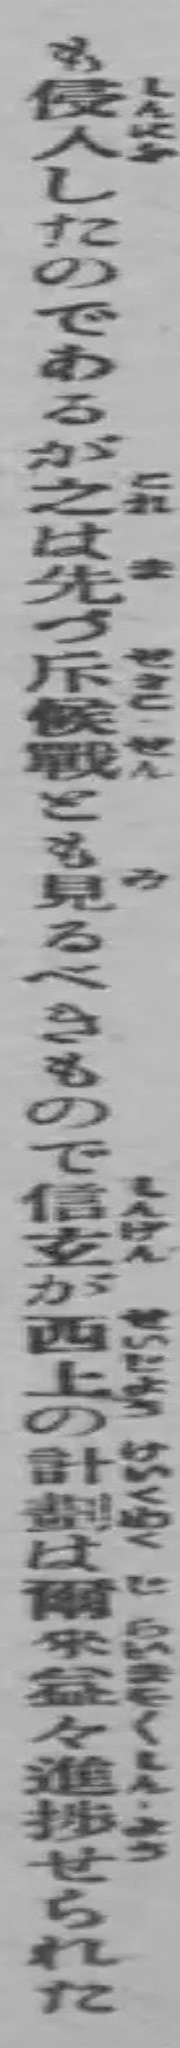も侵入したのであるが之は先づ斥候戦とも見るべきもので信玄が西上の計画は爾来益々進抄せられた
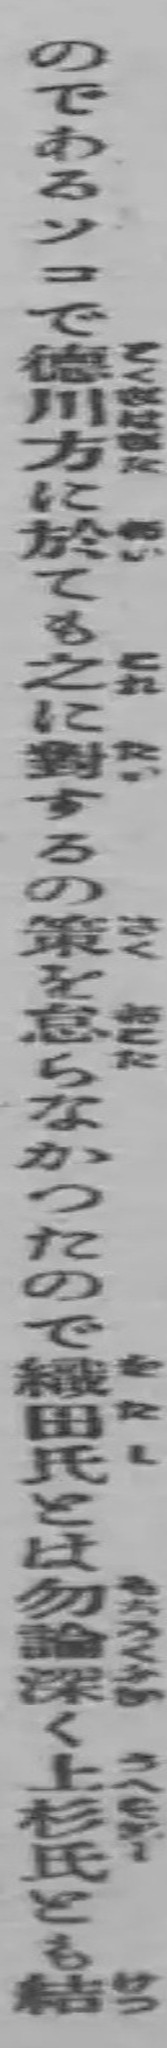のであるソコで徳川方に於ても之に対するの策を怠らなかつたので織田氏とは勿論深く上杉氏とも結
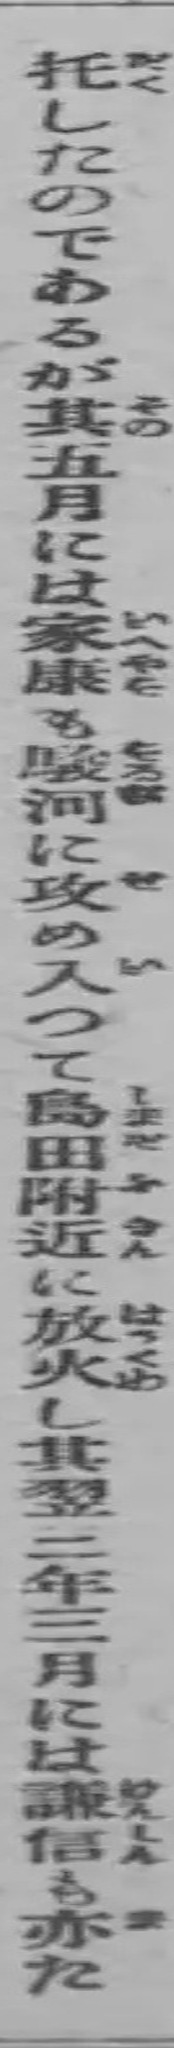托したのであるが其五月には家康も駿河に攻め入つて島田附近に放火し其翌二年三月には謙信も亦た
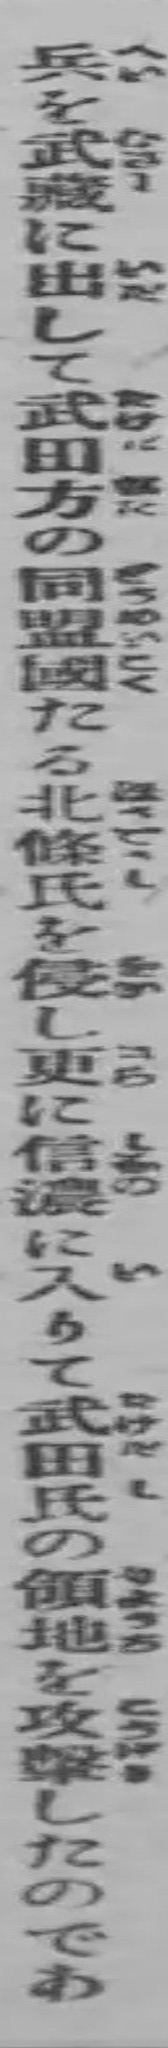兵を武蔵に出して武田方の同盟国たる北条氏を侵し更に信濃に入りて武田氏の領地を攻撃したのであ
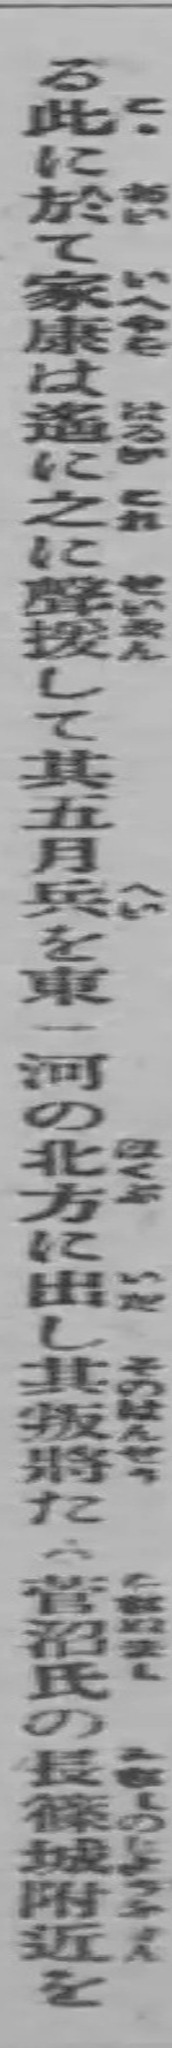る此に於て家康は遥に之に声援して其五月兵を東三河の北方に出し其叛将たる菅沼氏の長篠城附近を
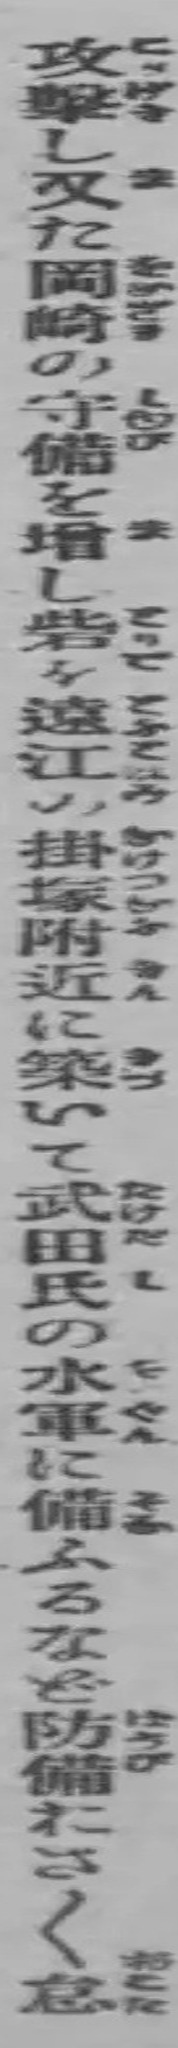攻撃し又た岡崎の守備を増し砦を遠江の掛塚附近に築いて武田氏の水軍に備ふるなど防備おさ〳〵怠
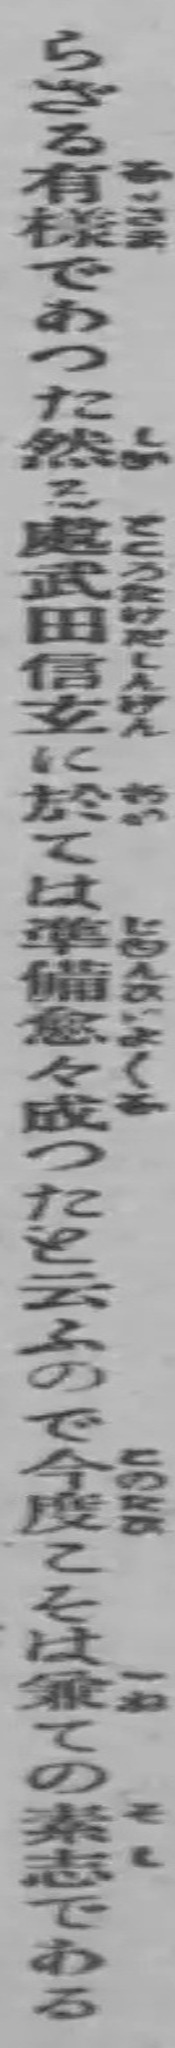らざる有様であつた然る処武田信玄に於ては準備愈々成つたと云ふので今度こそ兼ての素志である
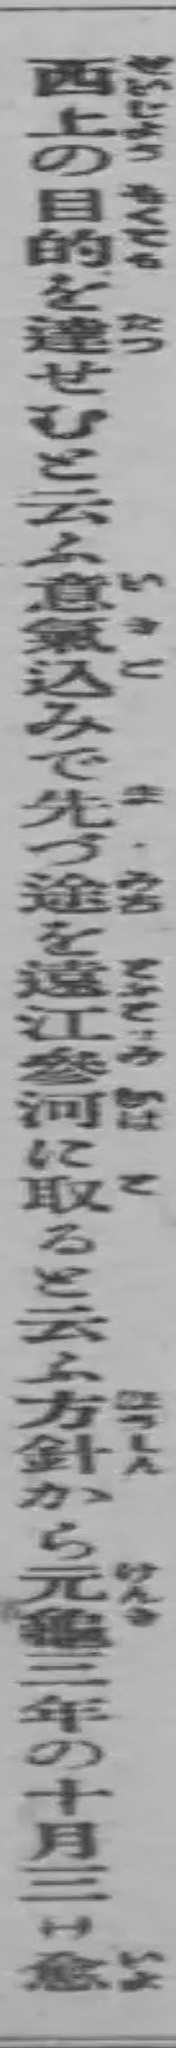西上の目的を達せむと云ふ意気込みで先づ途を遠江参河に取ると云ふ方針から元亀三年の十月三日愈
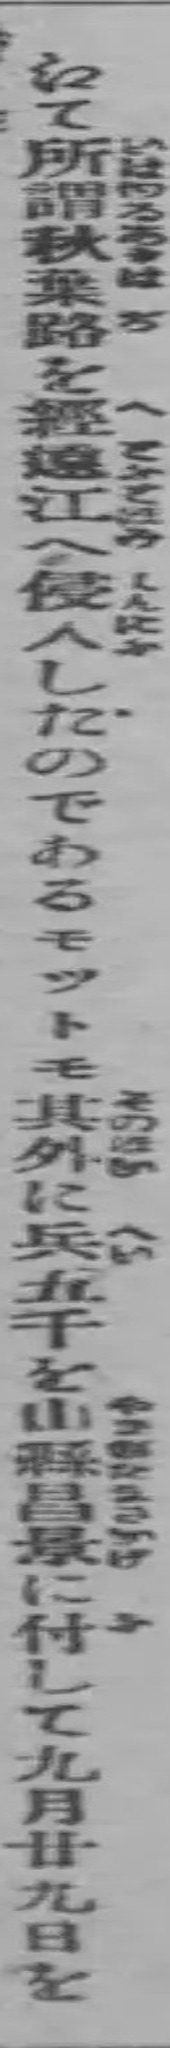遠江に入るえて所謂秋葉路を経遠江へ侵入したのであるモツトモ其外に兵五千を山縣昌景に付して九月廿九日を

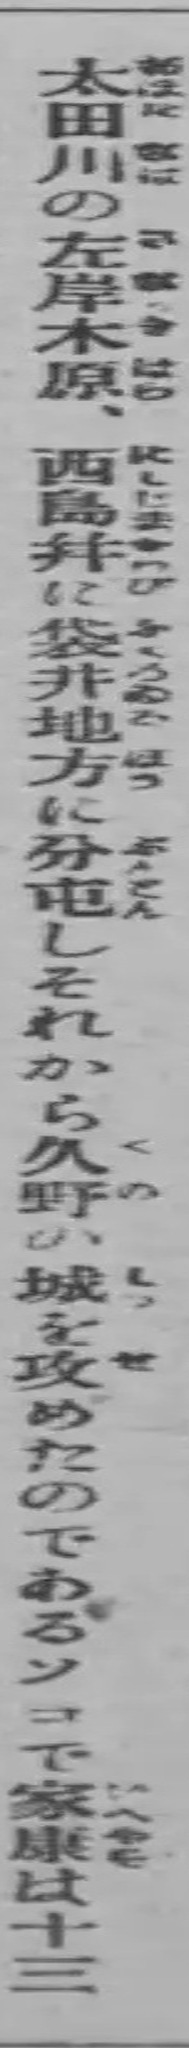太田川の左岸木原、西島幷に袋井地方に分屯しそれから久野の城を攻めたのであるソコで家康は十三
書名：豊橋市史談
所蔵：国立国会図書館 National Diet Library, JAPAN
